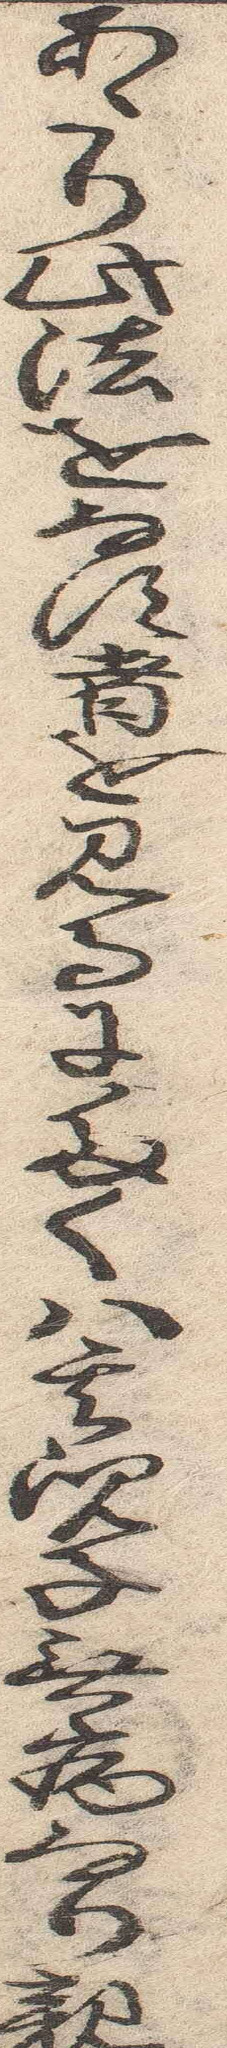あたり此法をなす者を見るに多くはその児子無病なり親
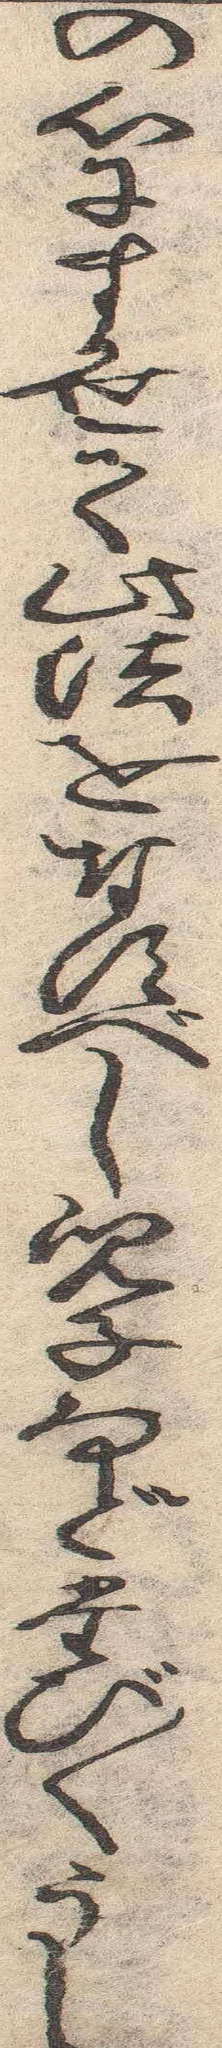の心にまかせて此法をなすべし児子などたび〳〵うし
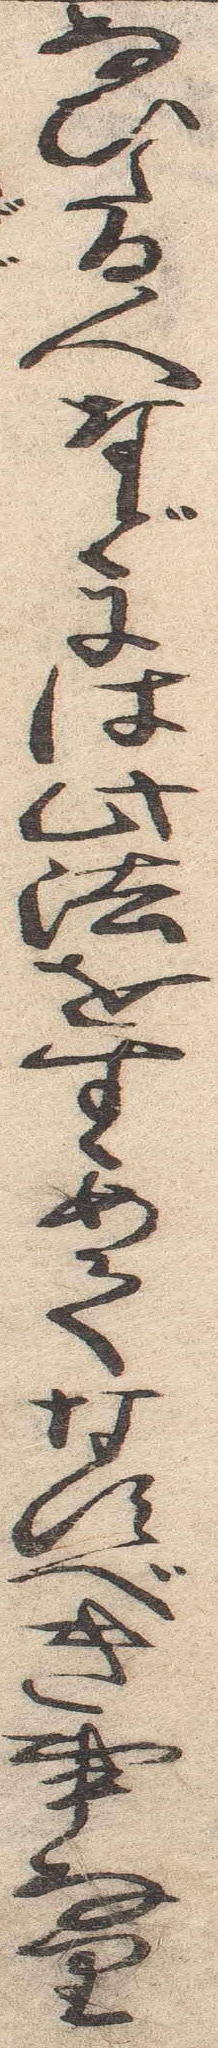なひたる人などには此法をすゝめてなすべき事なり
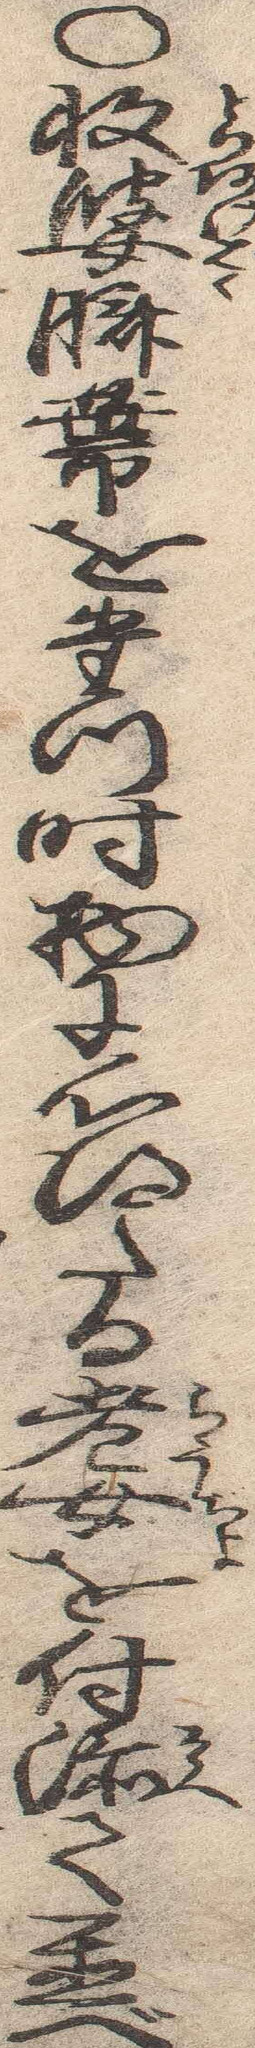◯収婆臍蔕をたつ時物に心得たる老女を付添て置べ
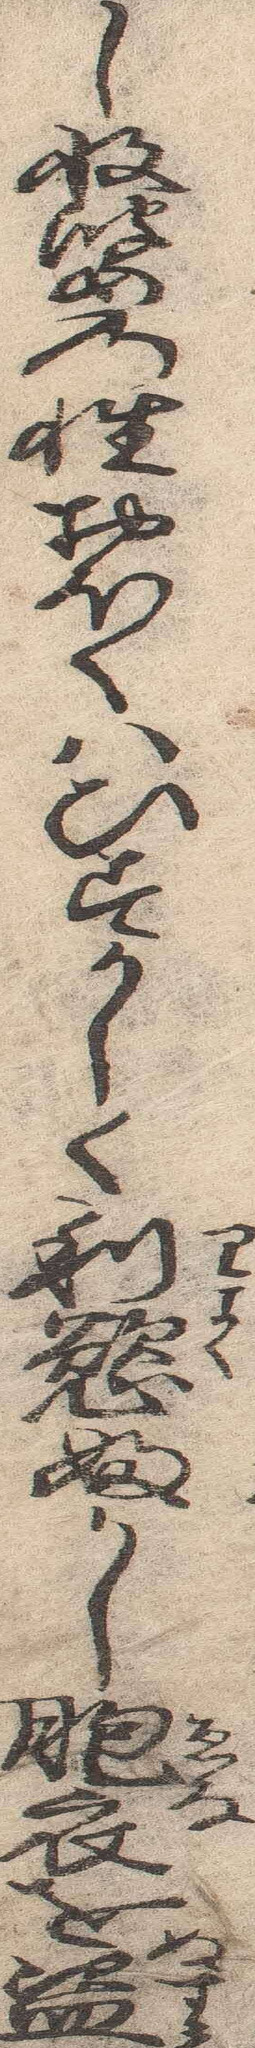し収婆の性おほくはひすかしく利慾ふかし胞衣を盗

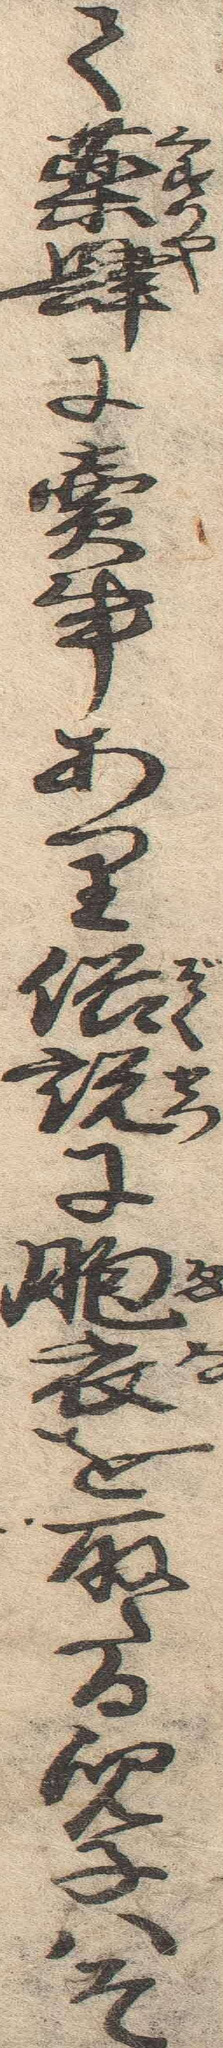て薬肆に賣事あり俗説に胞衣を取たる児子はそ
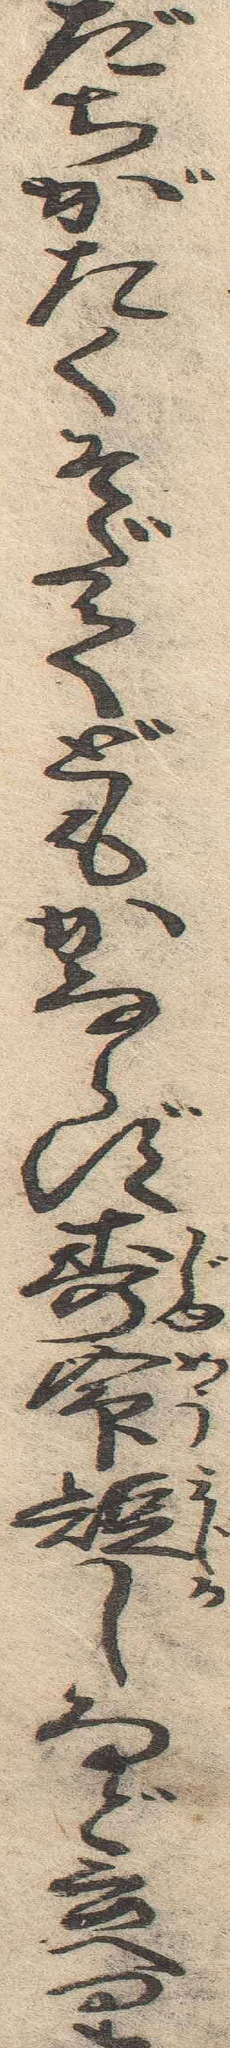だちがたくそだてどもかならず寿命短しなど云へり
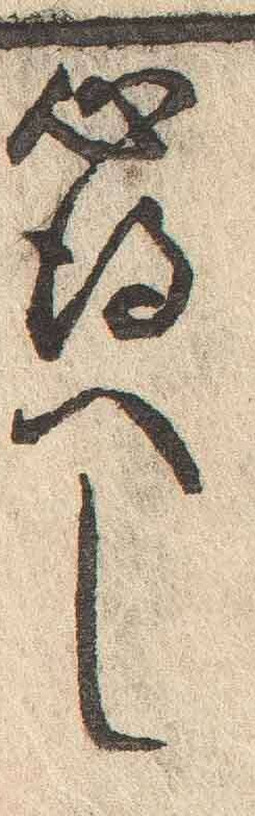心得へし
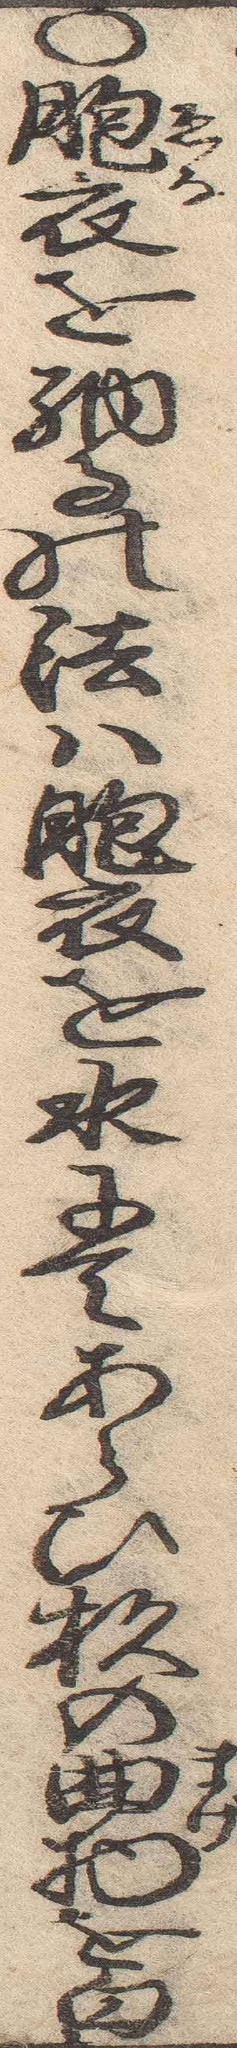◯胞衣を納るの法は胞衣を水にてあらひ杉の曲物を白
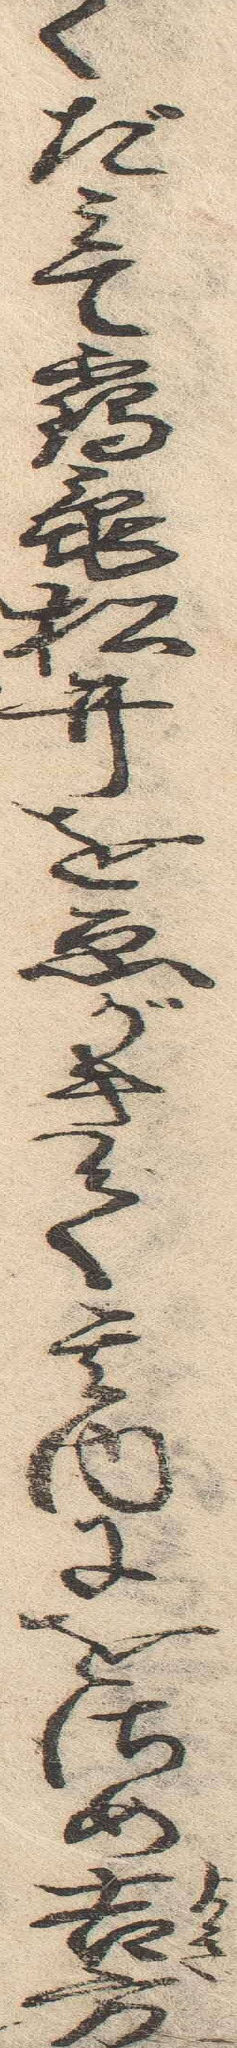くだみて鶴亀松竹をゑがきて其内にをさめ吉方
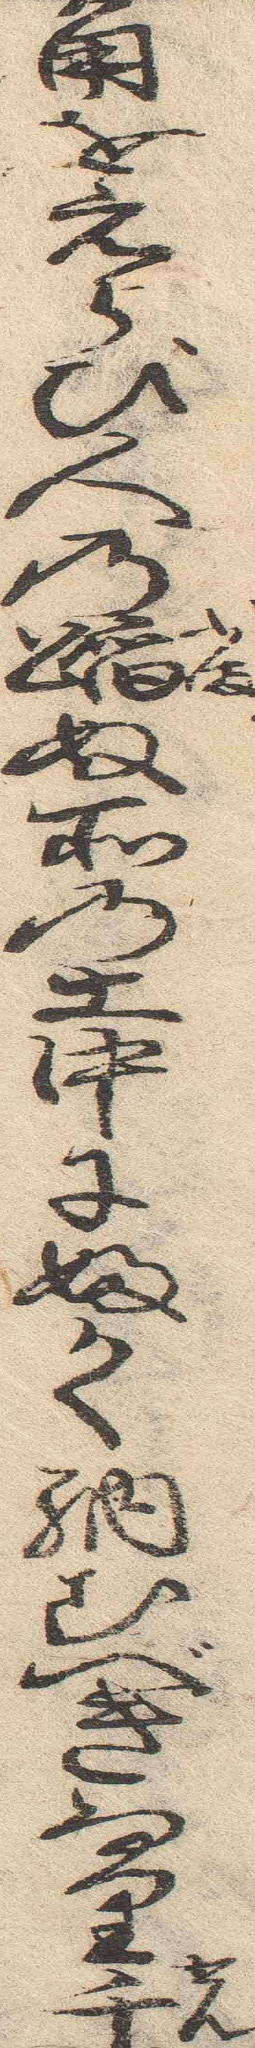角をえらび人の踏ぬ所の土中にふかく納むべきなり千
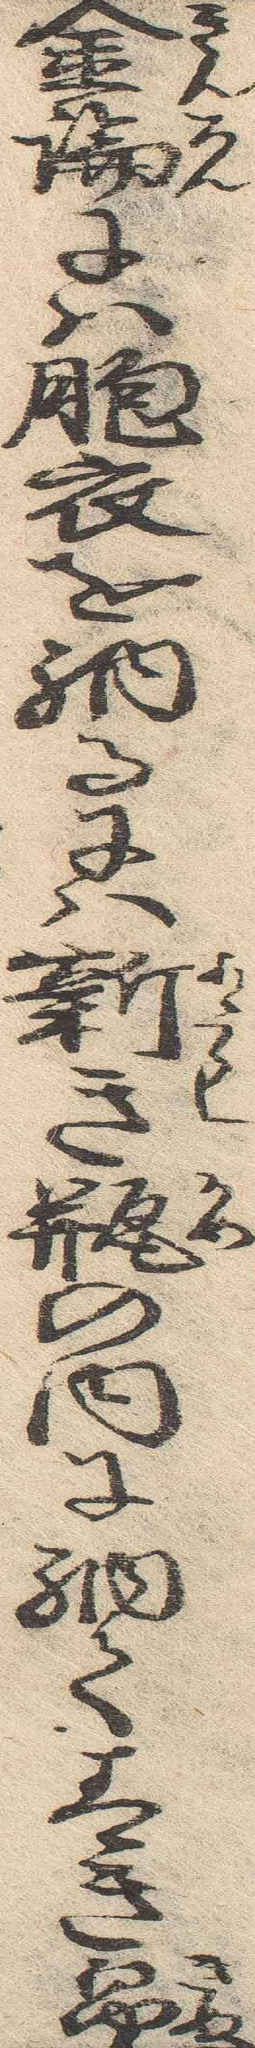金論には胞衣を納るには新き瓶の内に納て青き帛
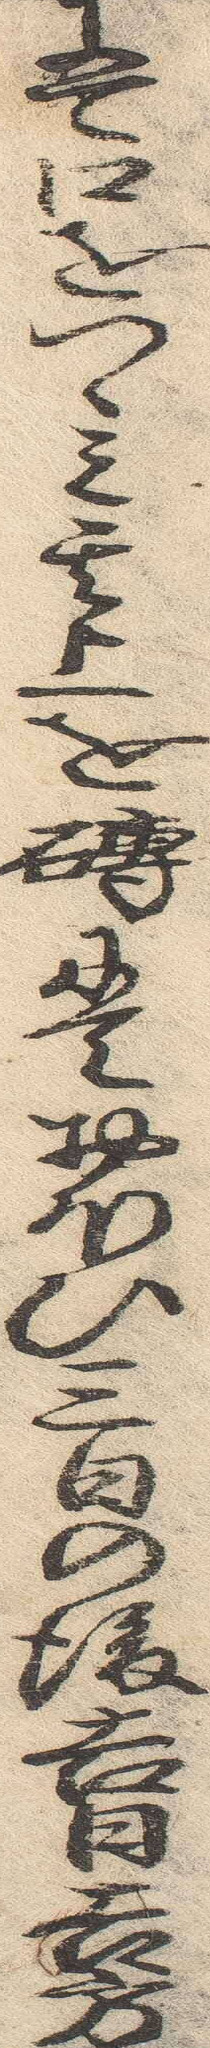にて口をつゝみ其上を磚にておほひ三日の後吉日吉方
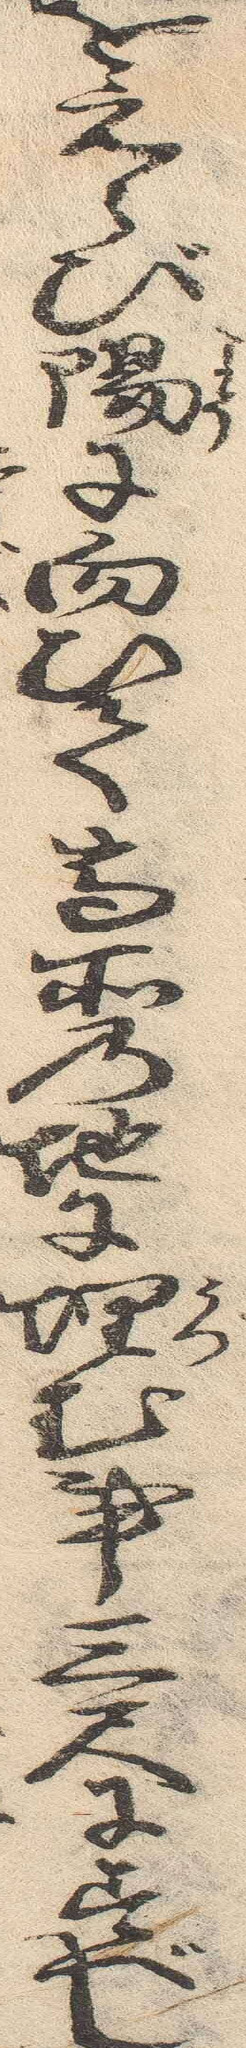をえらび陽に向ひて高所の地に埋む事三尺にすべし
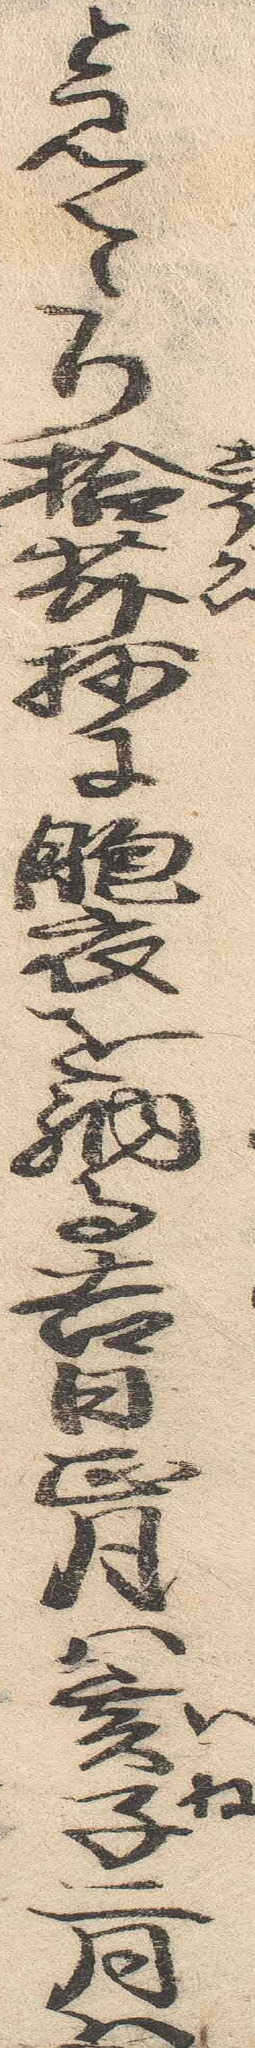と見えたり拾芥抄に胞衣を納る吉日正月は亥子二月は
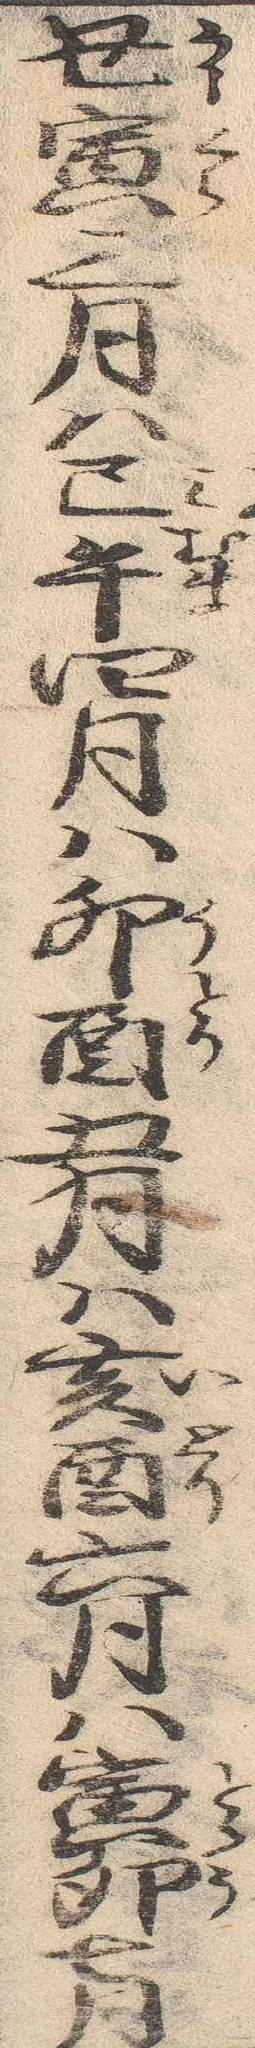丑寅三月は巳午四月は卯酉五月は亥酉六月は寅卯七月
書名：小児必用養育草
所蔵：東京学芸大学附属図書館 国文学研究資料館
